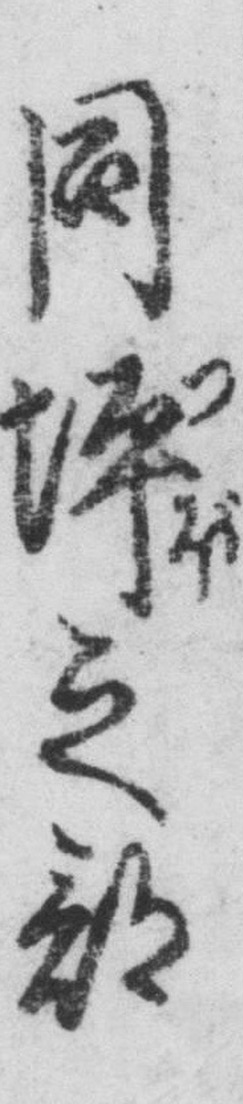同坪之部
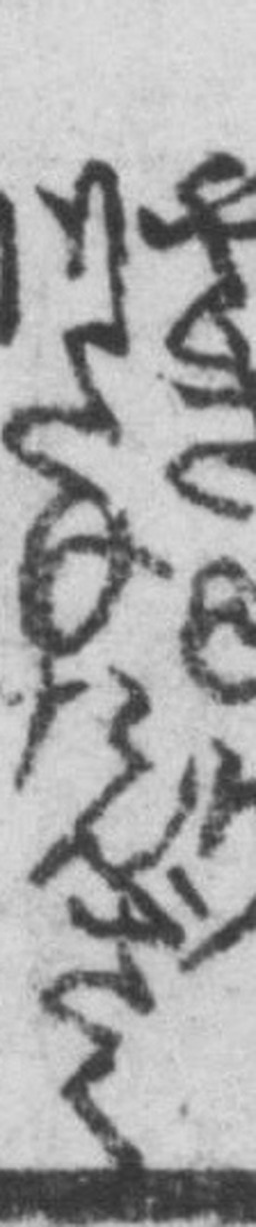川たけたんざく
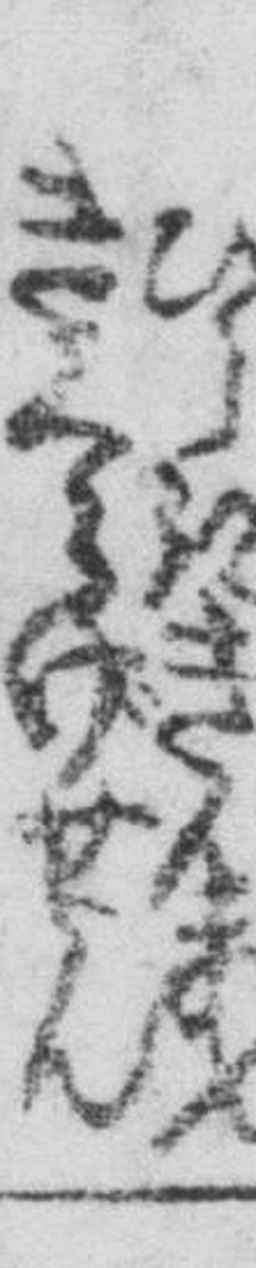きくらけせん
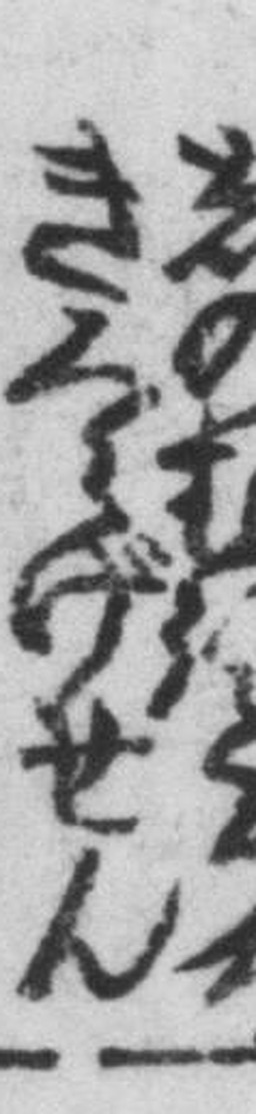きくらけせん
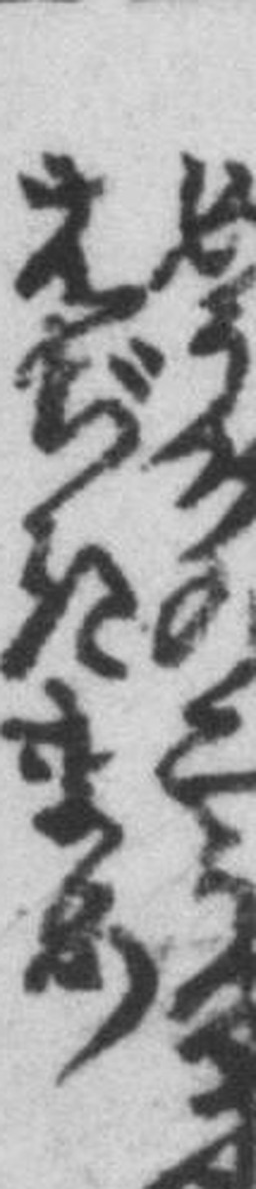はじきまめ
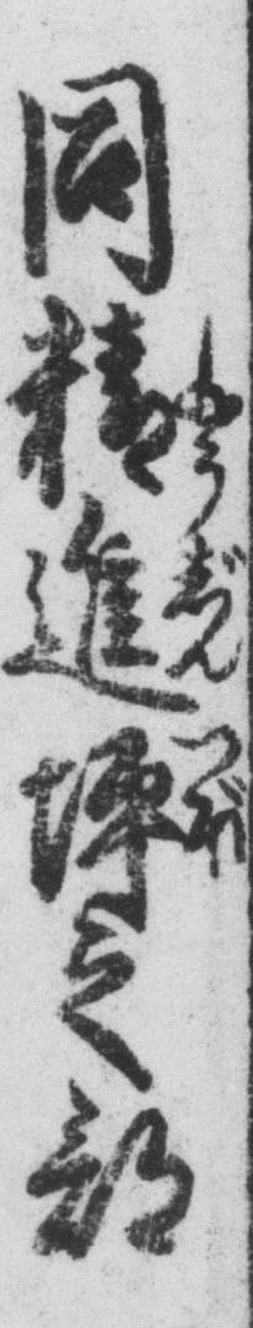同精進坪之部
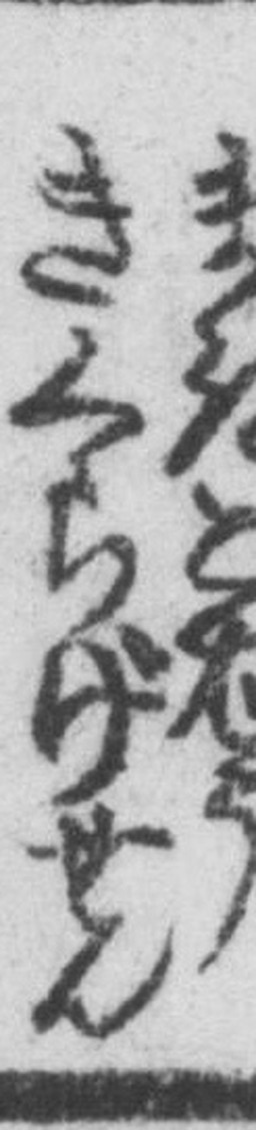きくらけせん
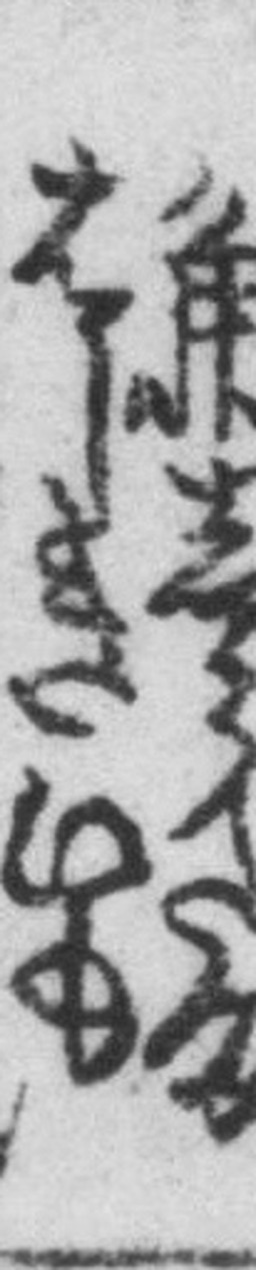はじきまめ
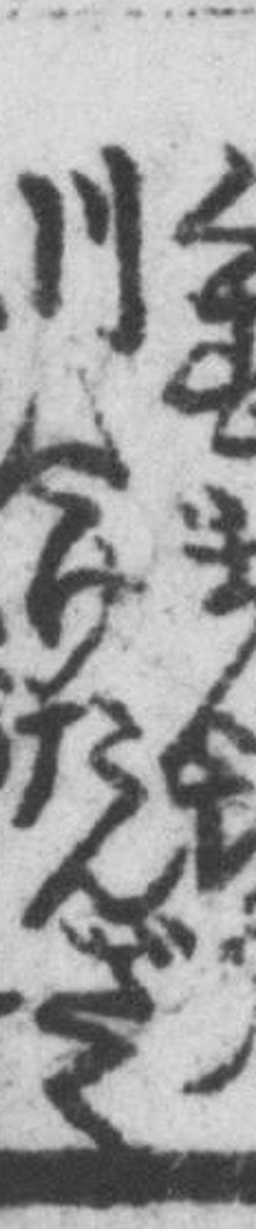川たけたんざく
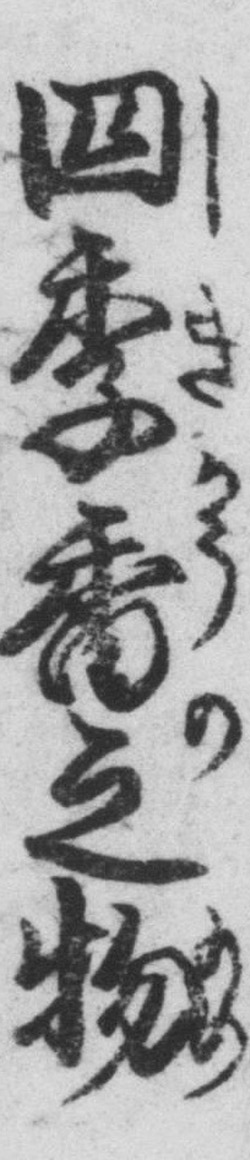四季香之物
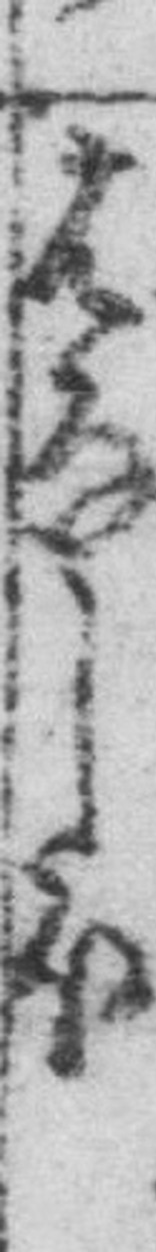はなしほ

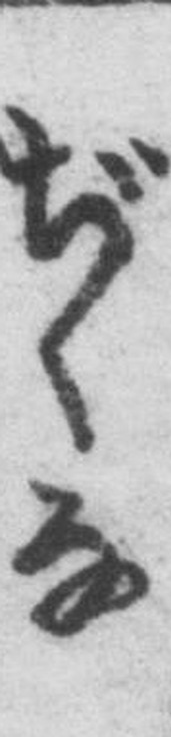ぢくな
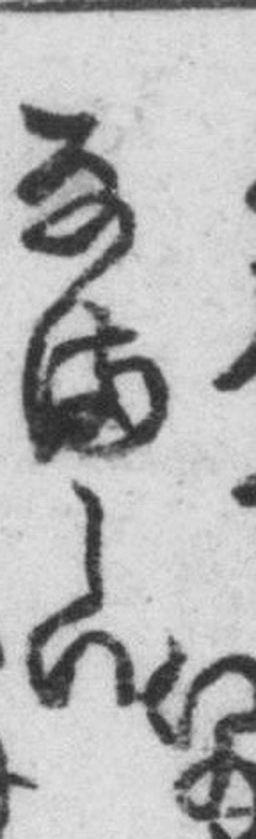なましい
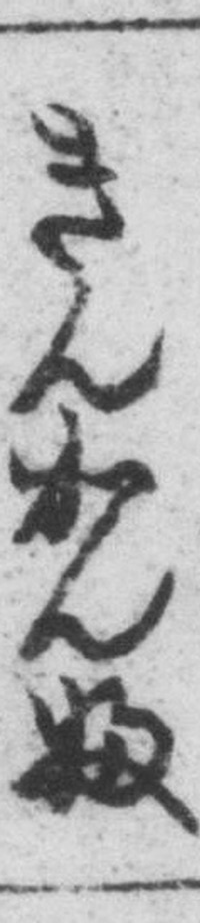きんかんふ
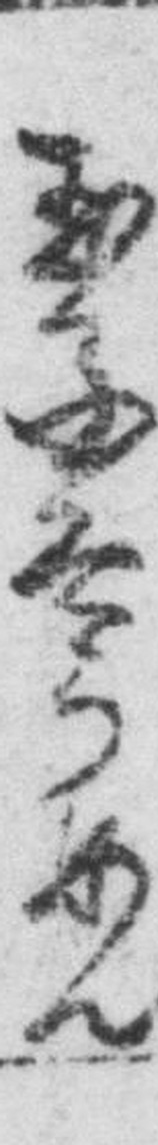身玉子そうめん
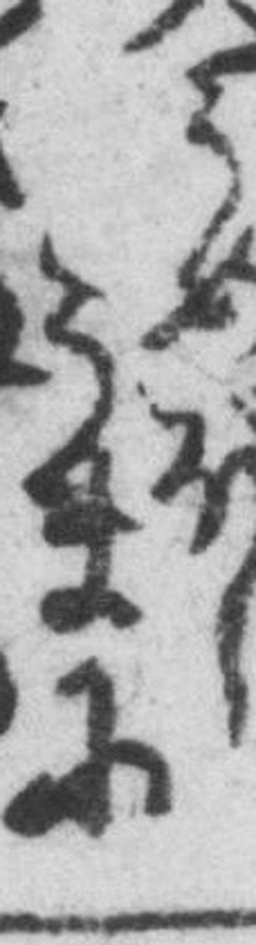うまに
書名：即席庖丁
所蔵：大阪府立大学学術情報センター 国文学研究資料館
